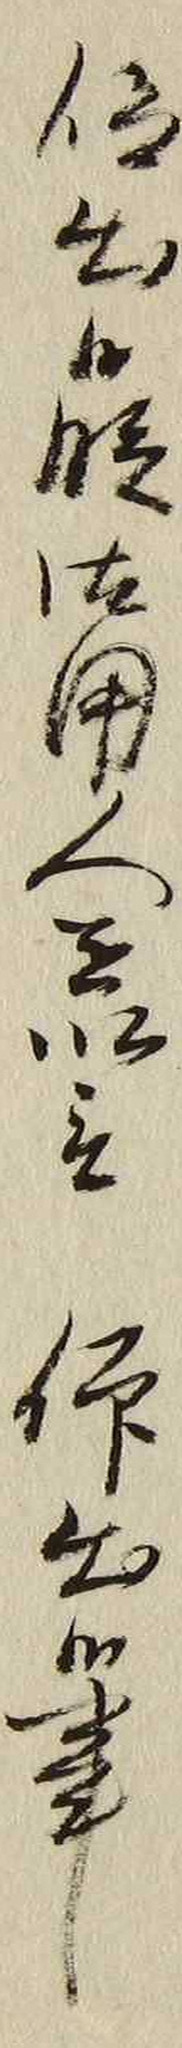仰出候段御用人を以被仰出候事
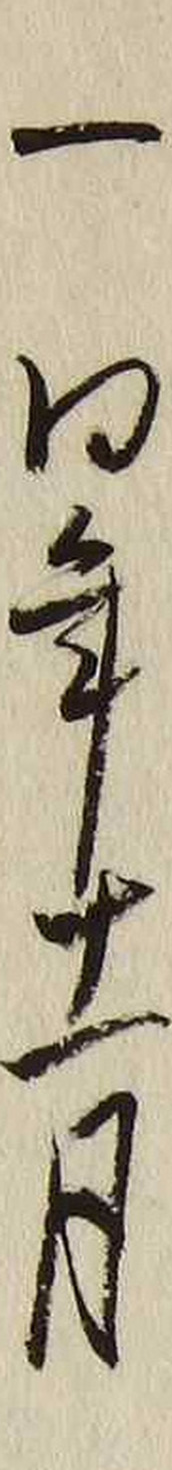一同年十一月
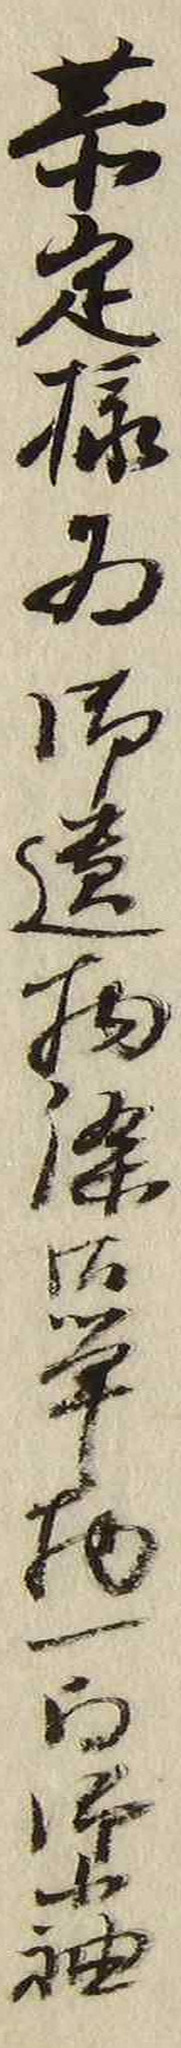恭定様為御遺物染御単物一白御小袖

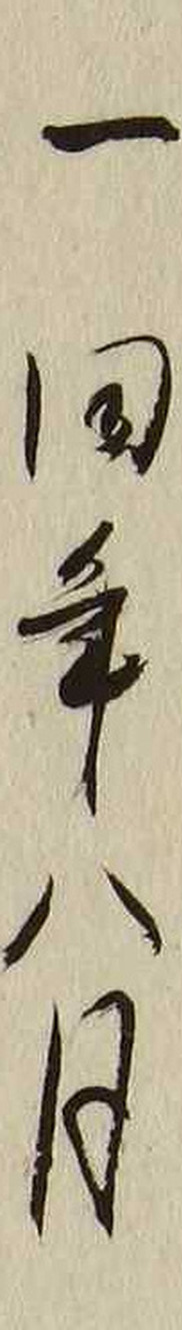一同年八月
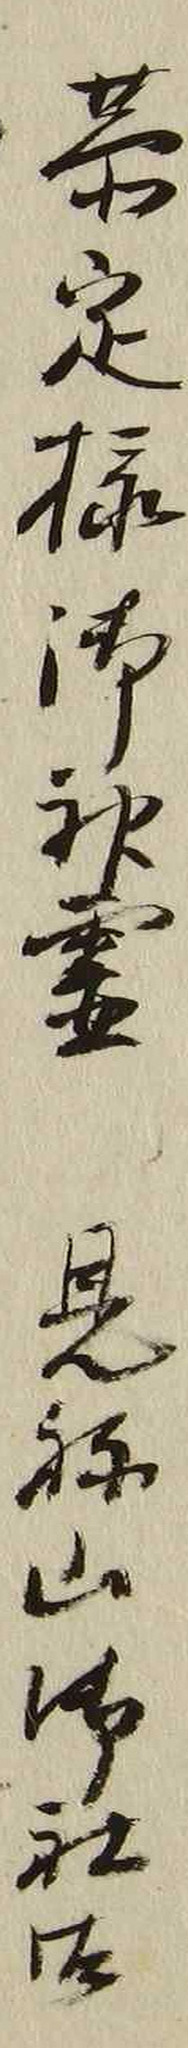恭定様御神霊見禰山御社御
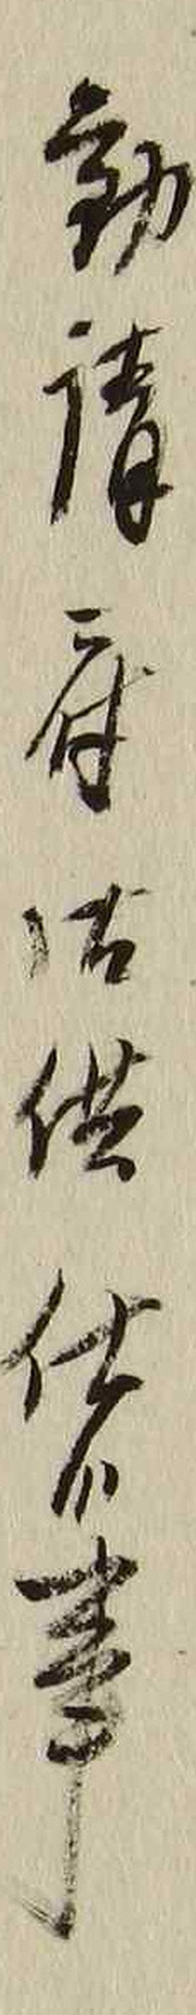勧請ニ付御供仕候事
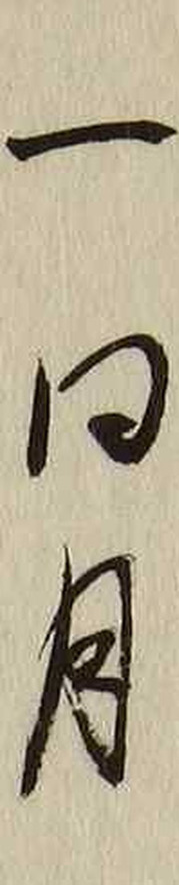一同月
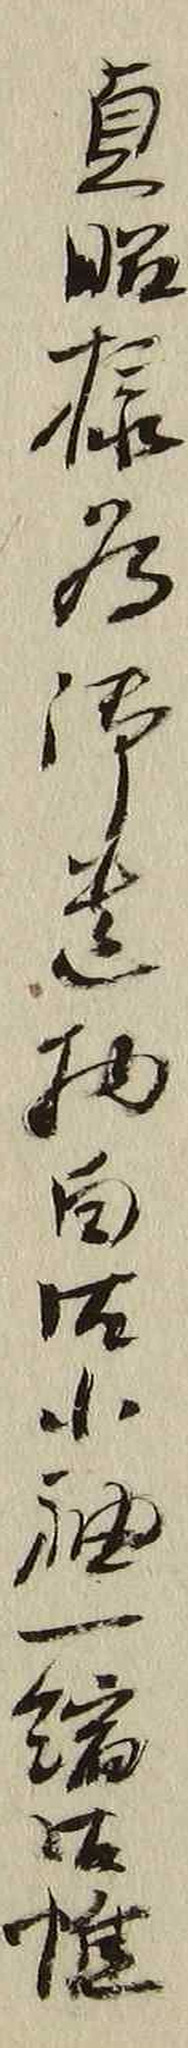貞昭様為御遺物白御小袖縮一縮御惟
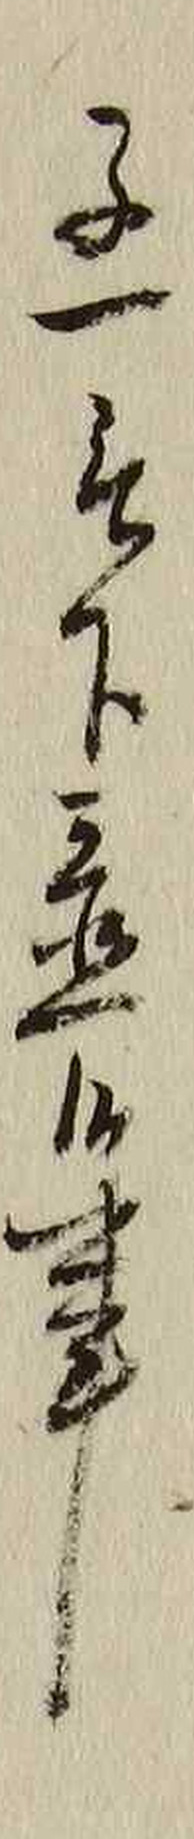子一被下置候事
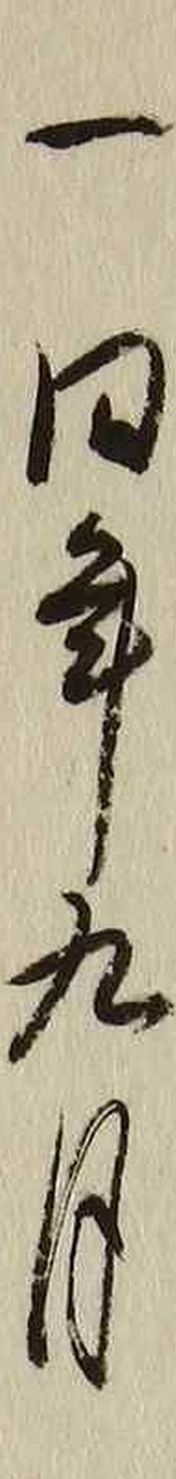一同年九月
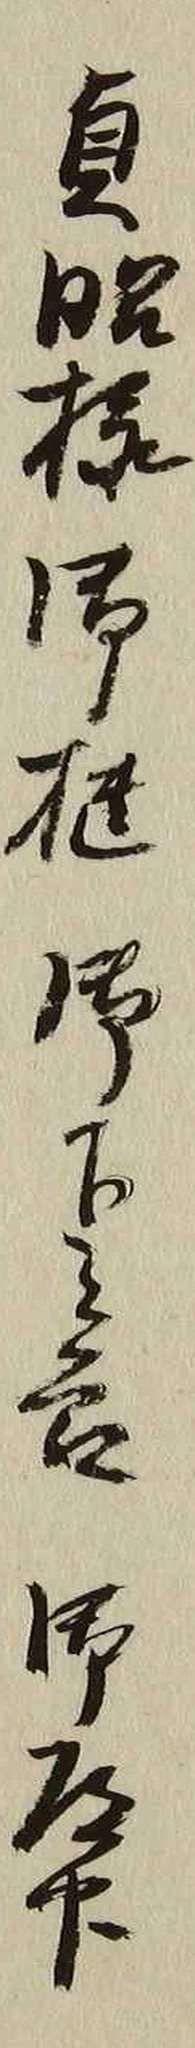貞昭様御櫃御下之節御道下
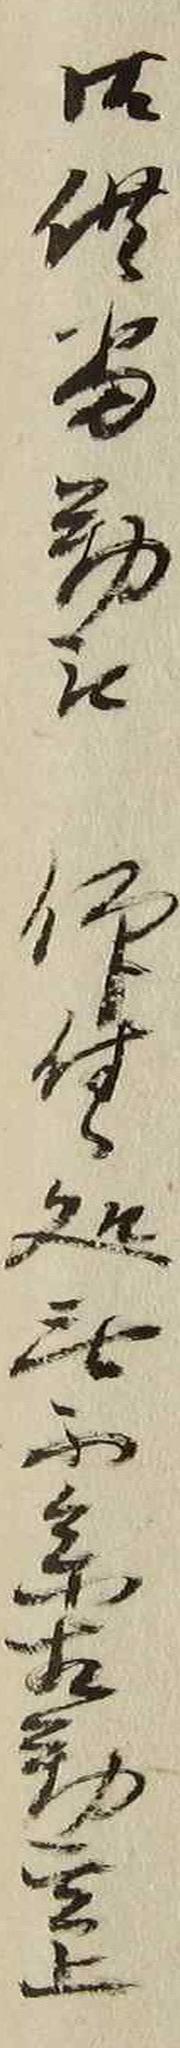御供番被仰付候処無不参相勤其上
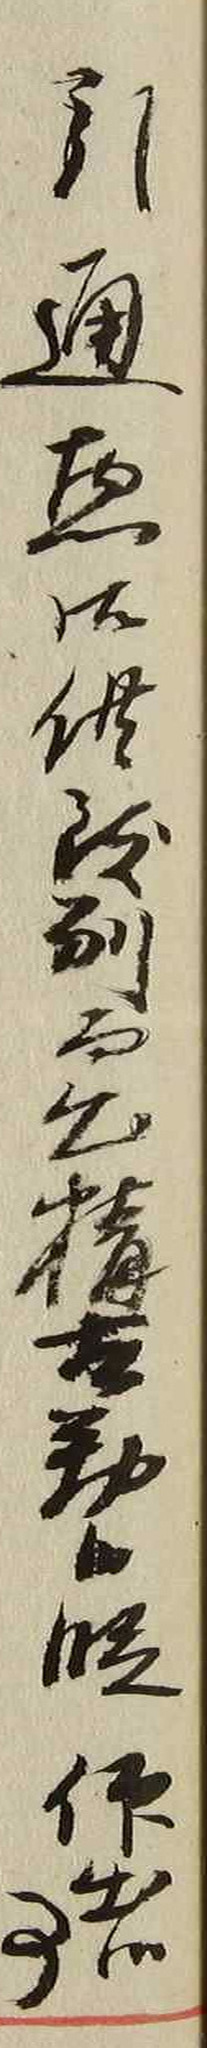引通惣御供致別而出精相勤候段仰出候事
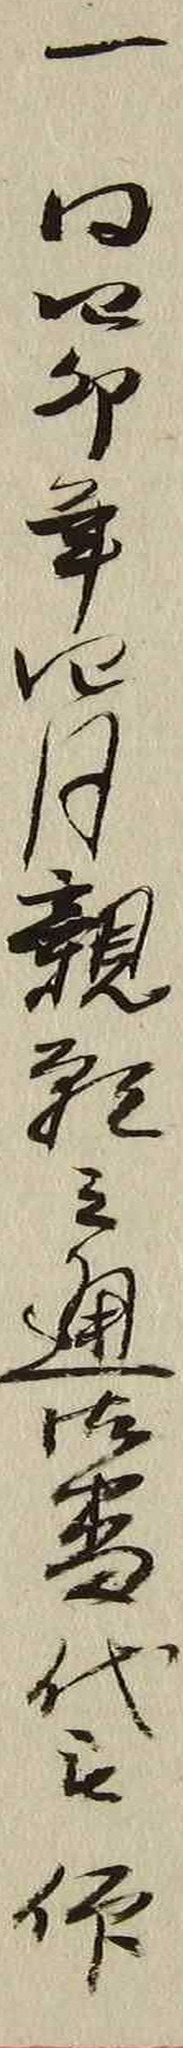一同四卯年四月親願三通御番代被仰
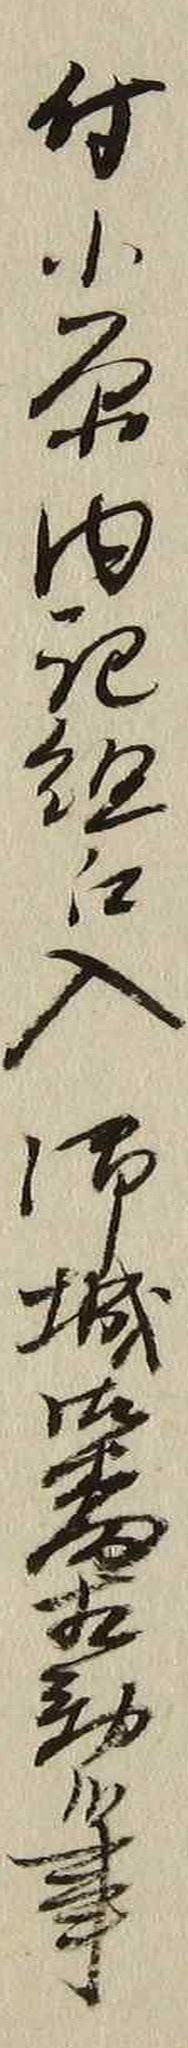付小原内記組江入御城御番相勤候事
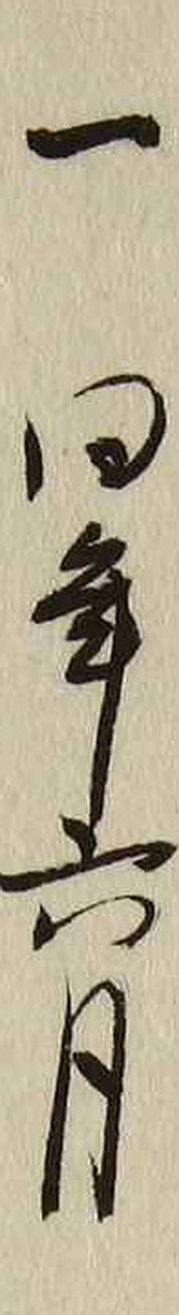一同年六月
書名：諸士系譜　巻之345　も之部1
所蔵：会津若松市立会津図書館
